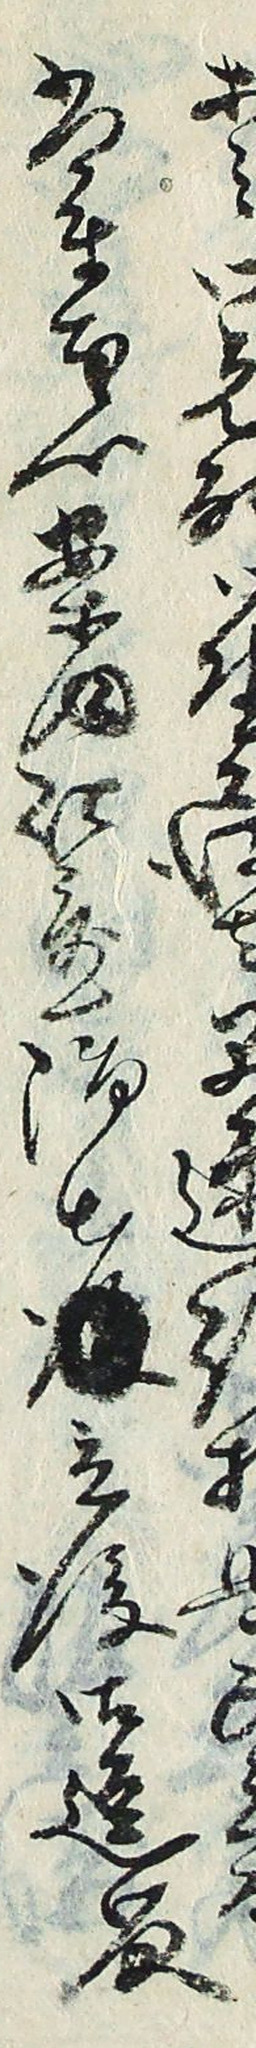書付を以案内仕置御出立後御逗留
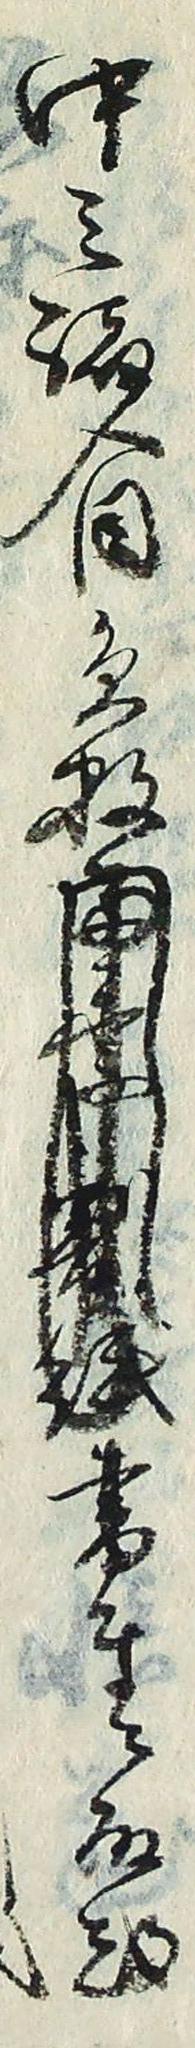中之諸入目員数書付に取都
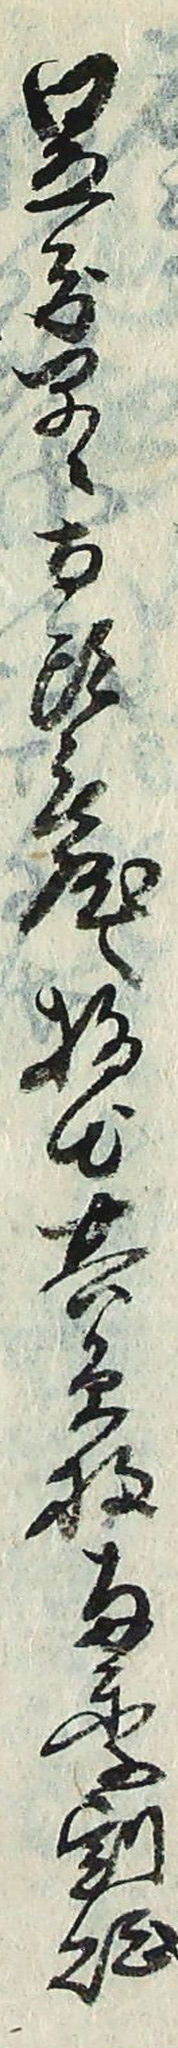是亦早々与頭庄屋へ指出其員数両季割賦
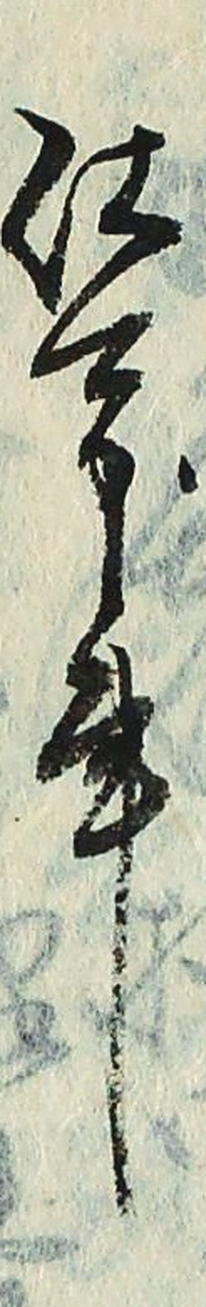仕可申事
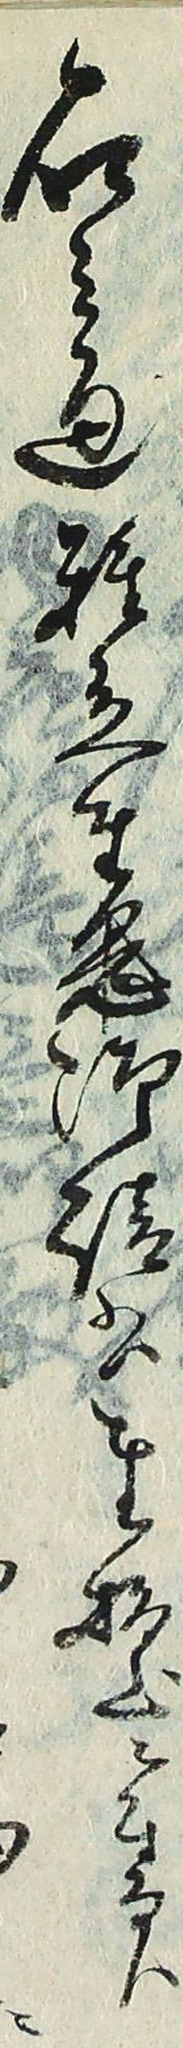右之通難有奉畏御請書奉指上に付而は
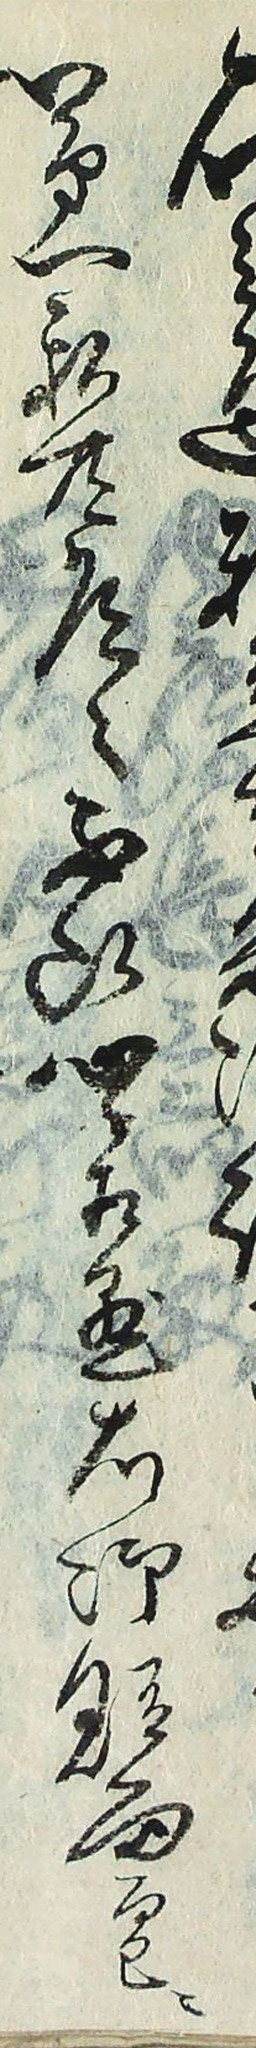第一私共常々不断心を相懸右御賄向而已に
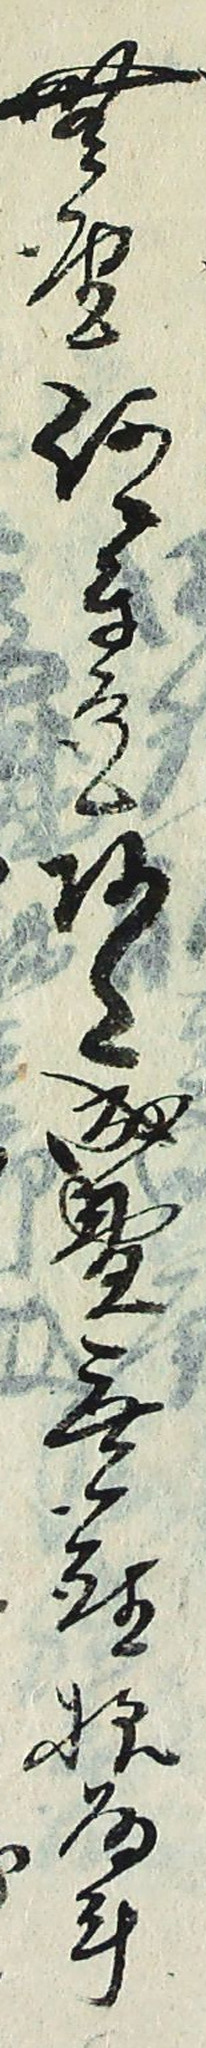無御坐何に付而もあた成費無御座様取計
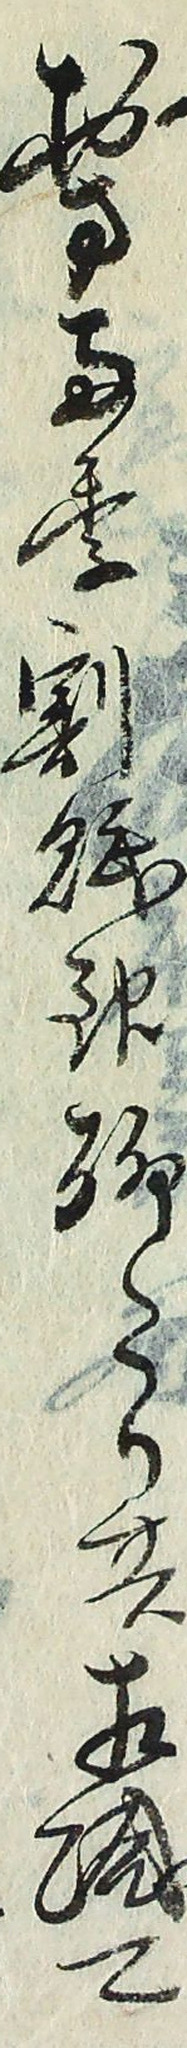村方両季割賦銀聊たり共相減可
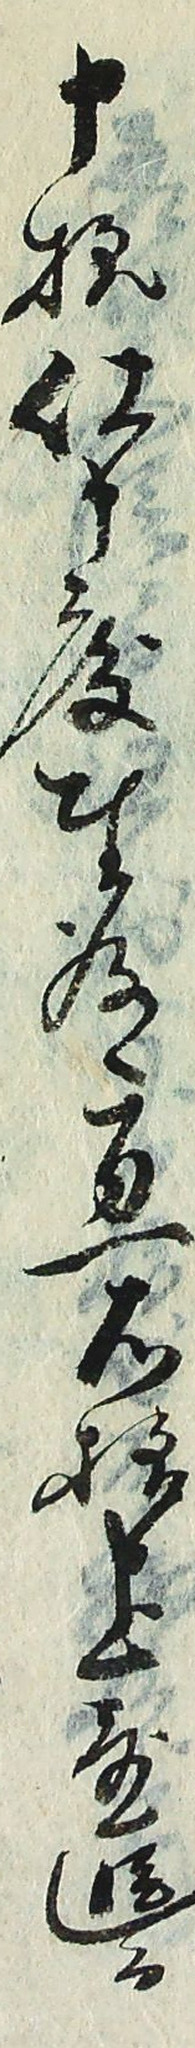申様仕申度奉存候万一右様申上置追而
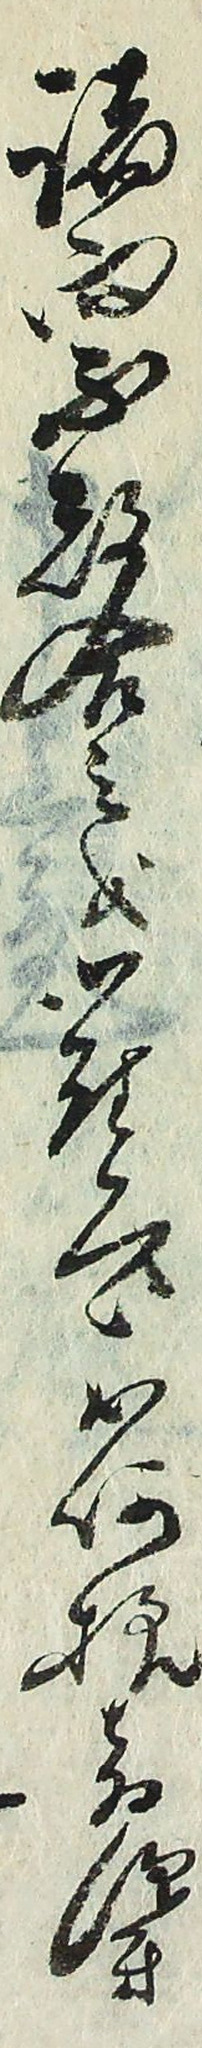諸向不都合之義御坐候はゝ如何様被為仰付
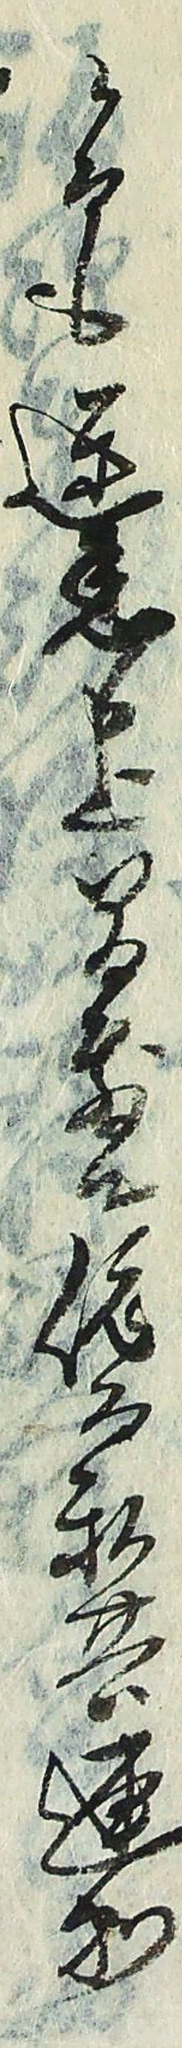候而も迷惑申上間敷候依而私共連判
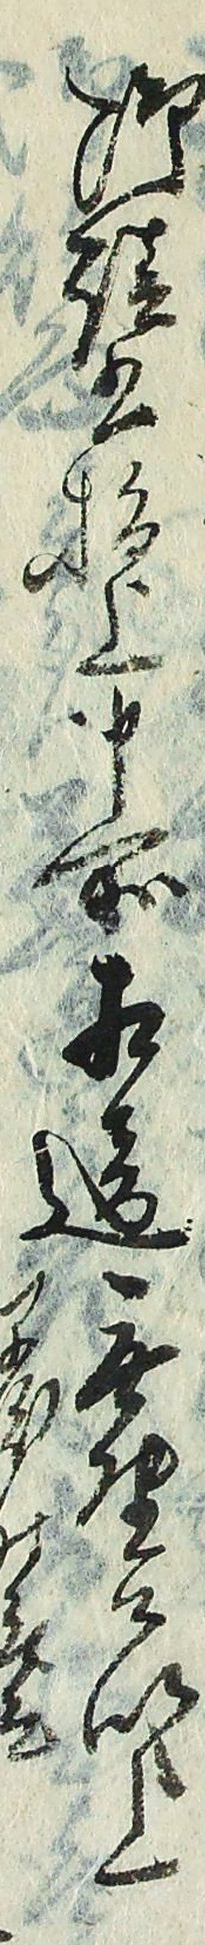御請書指上申所相違無御坐候以上
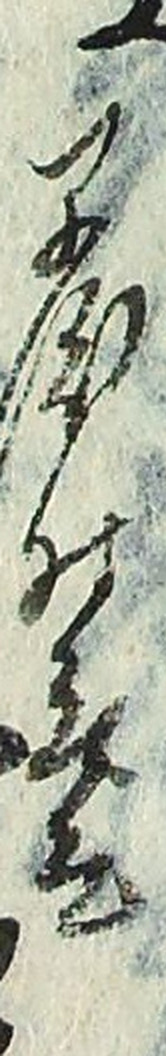早淵村庄屋
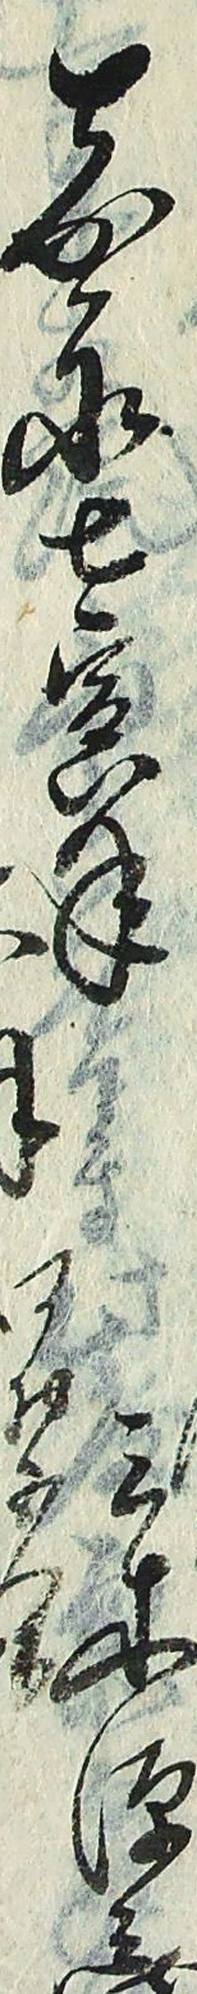嘉永七寅年三木源兵衛
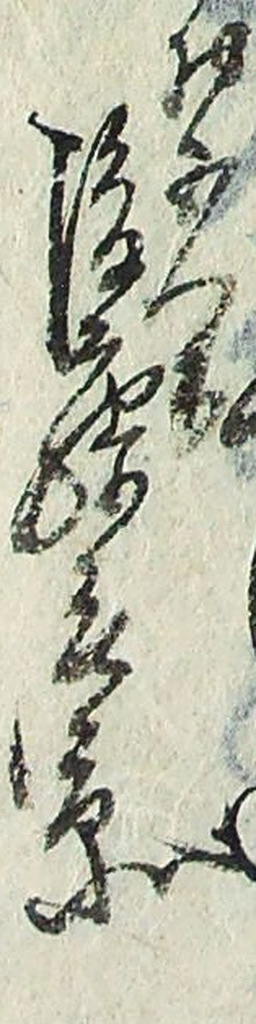後藤庄兵衛

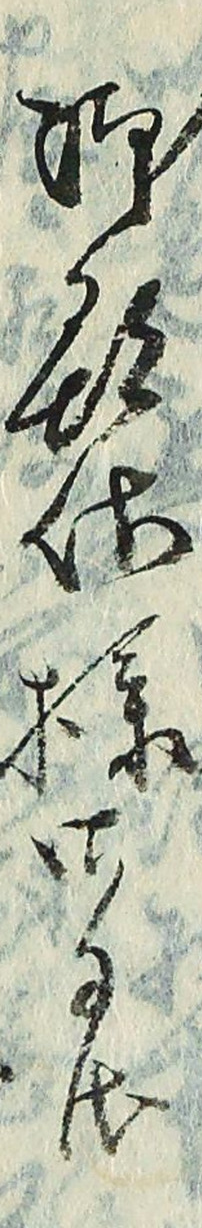御郡代様御手代
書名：諸御用御□受書控
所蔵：鳴門教育大学 Naruto University of Education
